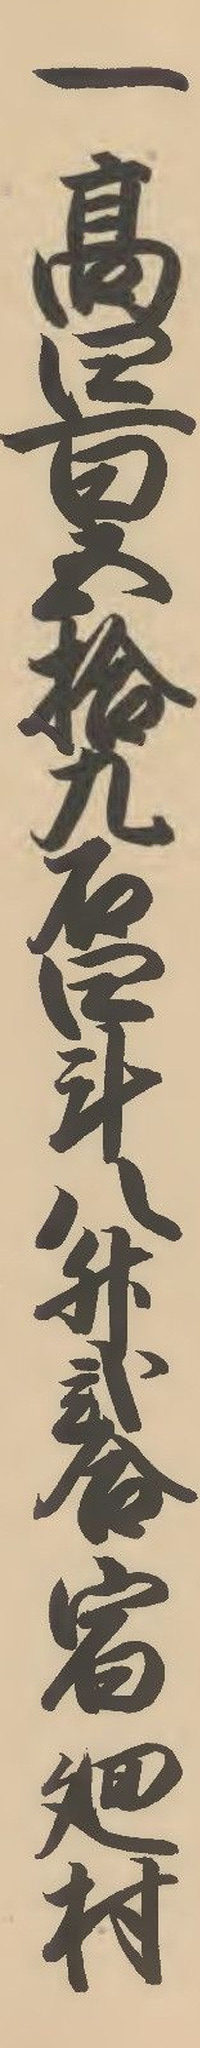一髙四百五拾九石四斗八升弐合宿廻村
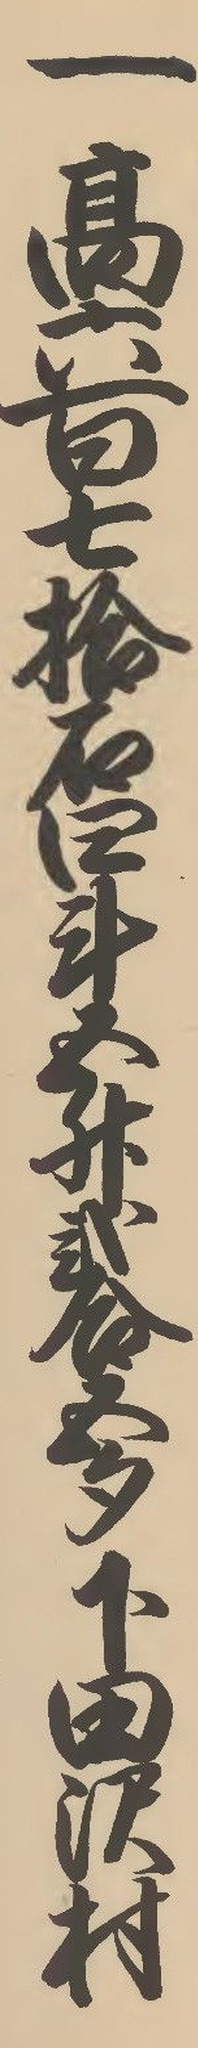一髙六百七拾石四斗五升弐合五夕下田沢村
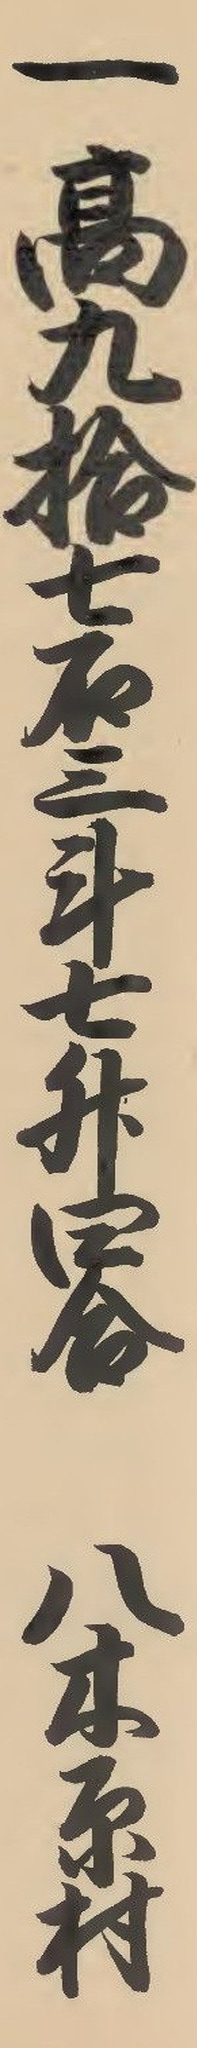一髙九拾七石三斗七升四合八木原村
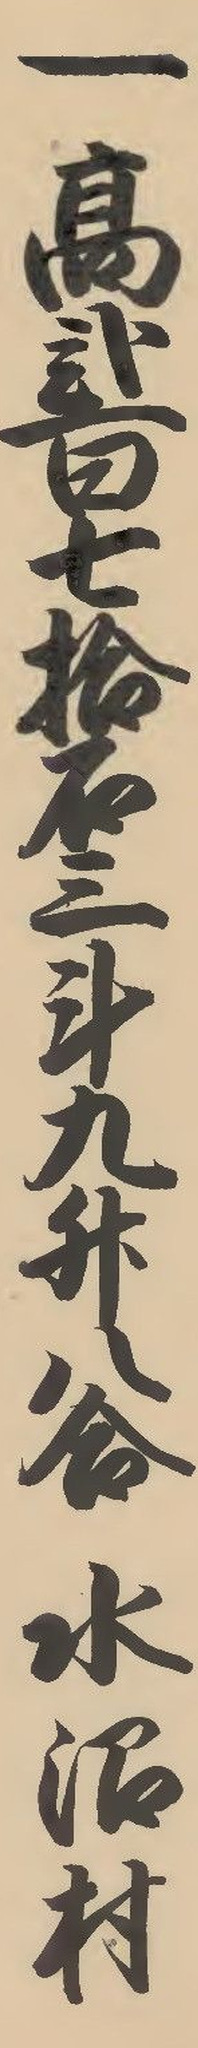一髙弐百七拾石三斗九升八合水沼村
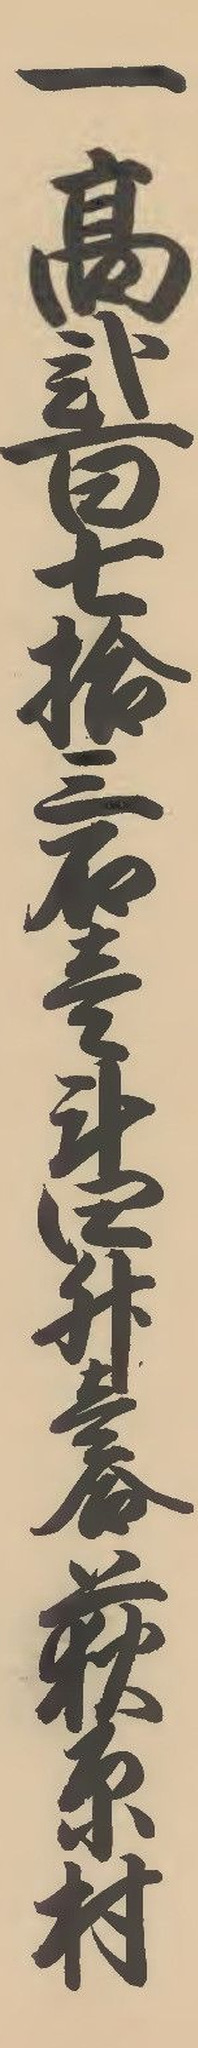一髙弐百七拾三石壱斗四升壱合原村
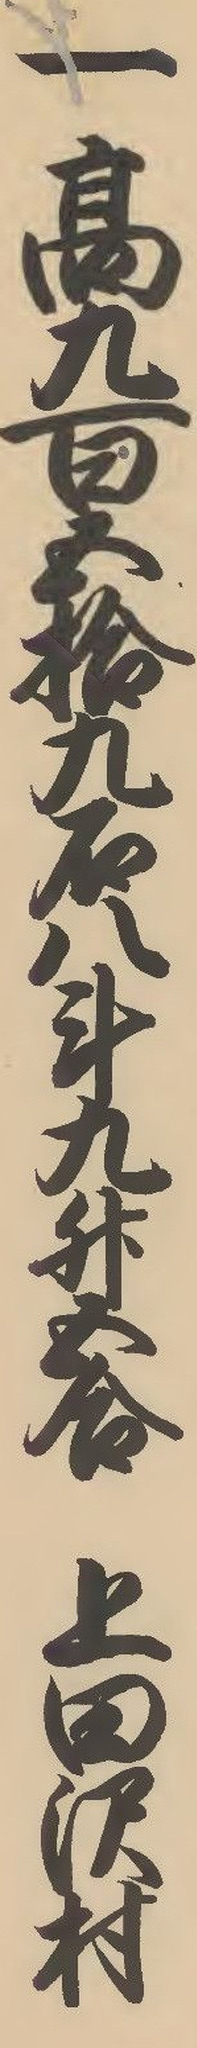一髙九百五拾九石八斗九升五合上田沢村

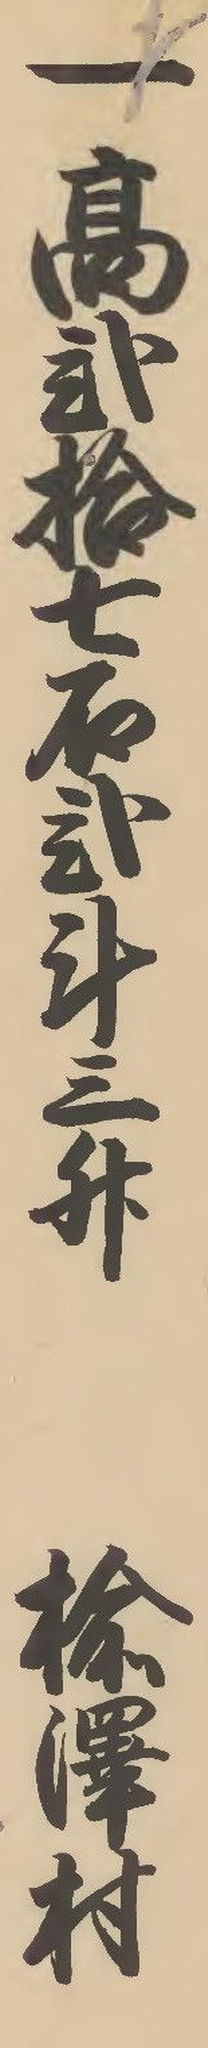一髙弐拾七石弐斗三升澤村
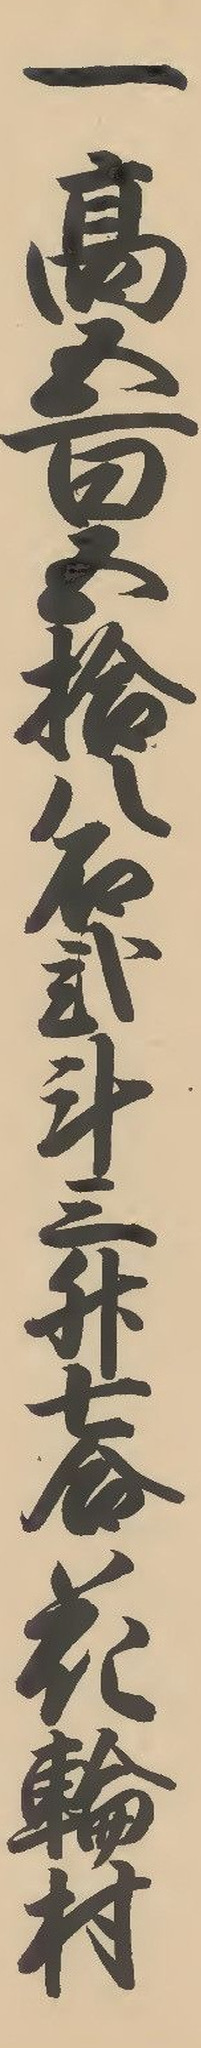一髙五百五拾八石弐斗三升七合花輪村
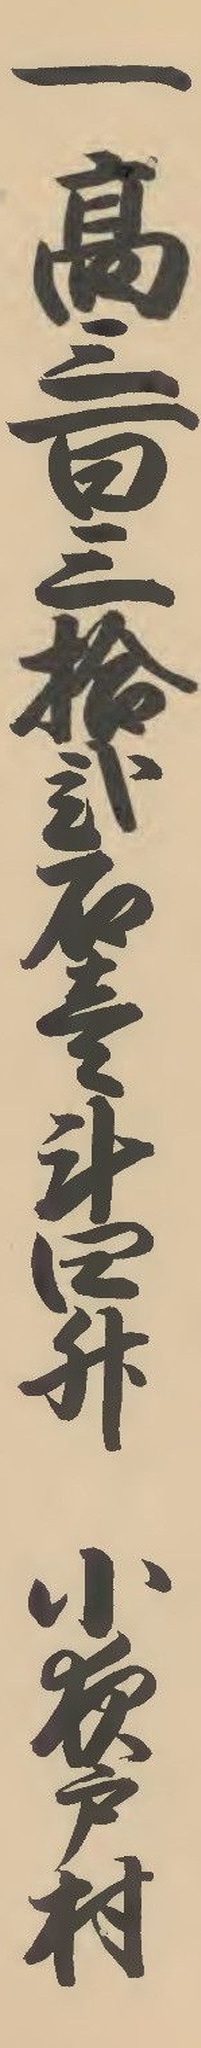一髙三百三拾弐石壱斗四升小夜戸村
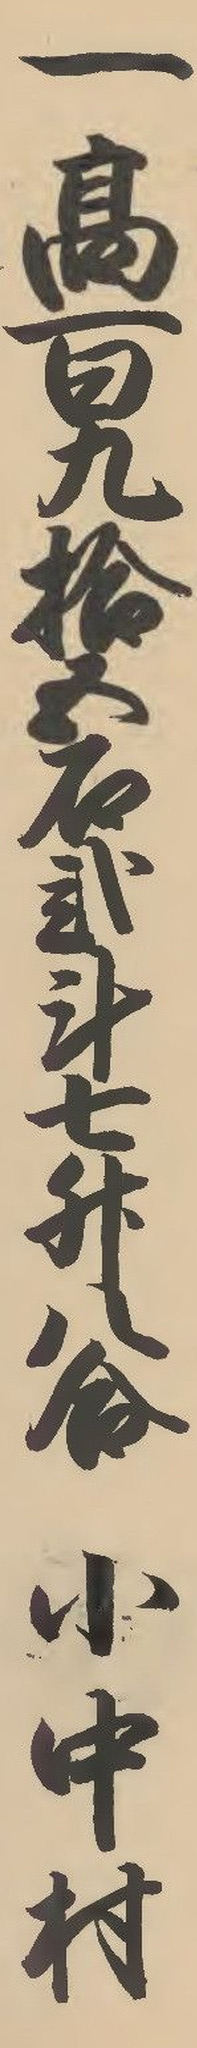一髙百九拾五石弐斗七升八合小中村
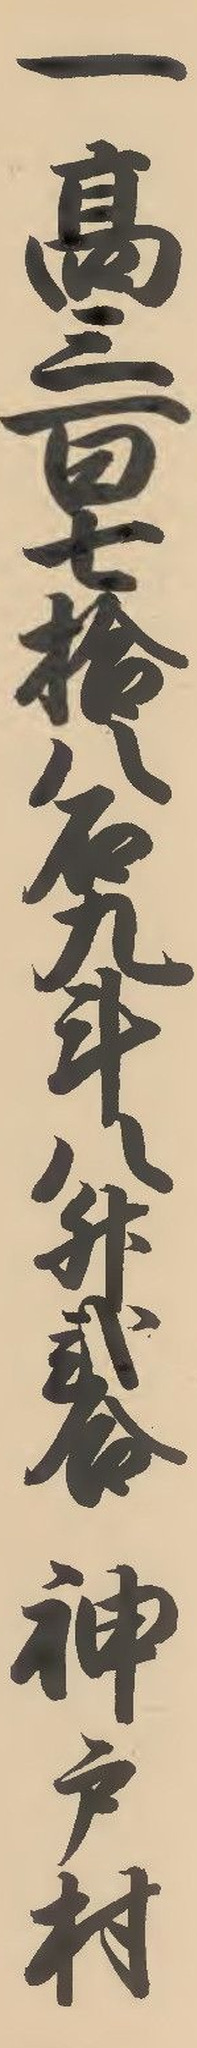一髙三百七拾八石九斗八升弐合神戸村
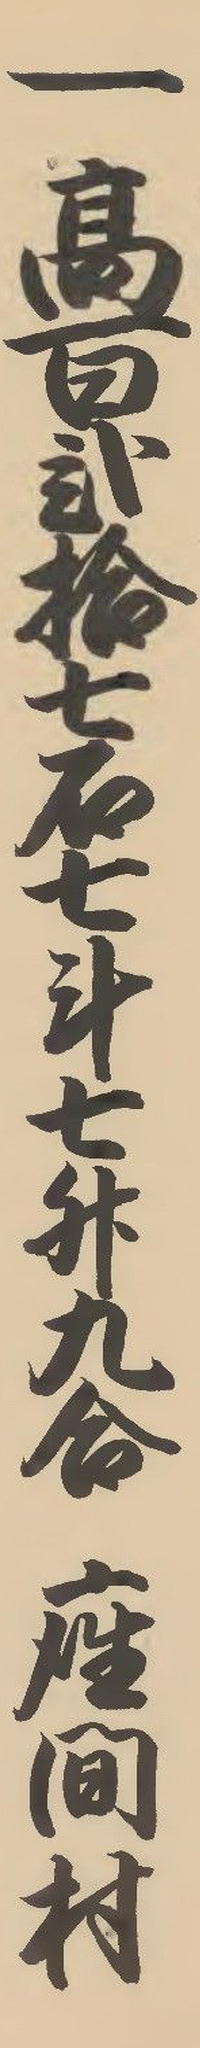一髙百弐拾七石七斗七升九合座間村
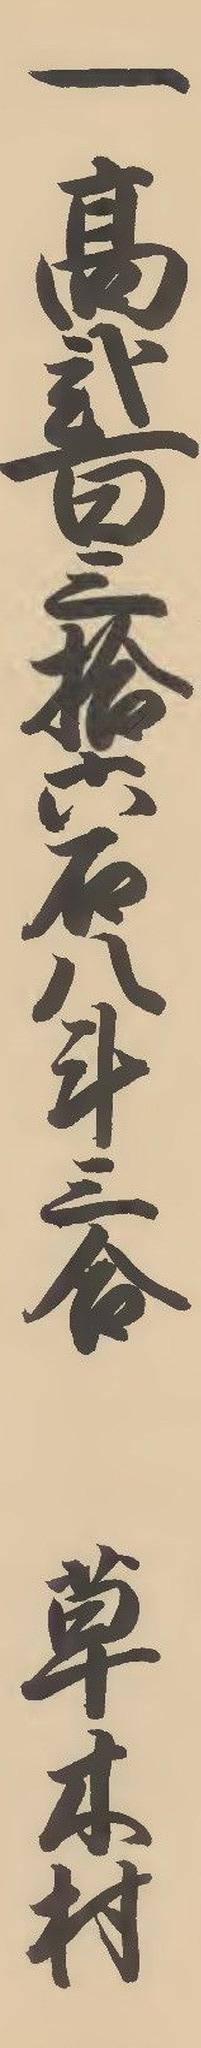一髙弐百三拾六石八斗三合草木村
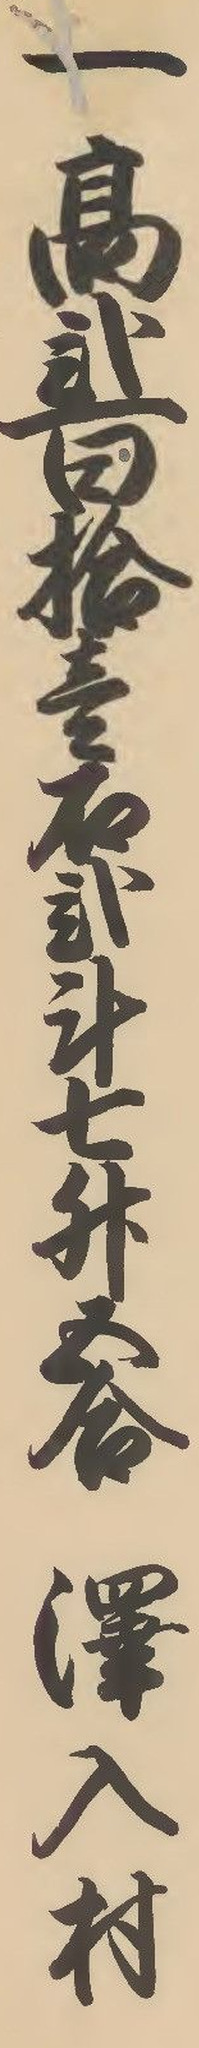一髙弐百拾壱石弐斗七升五合澤入村

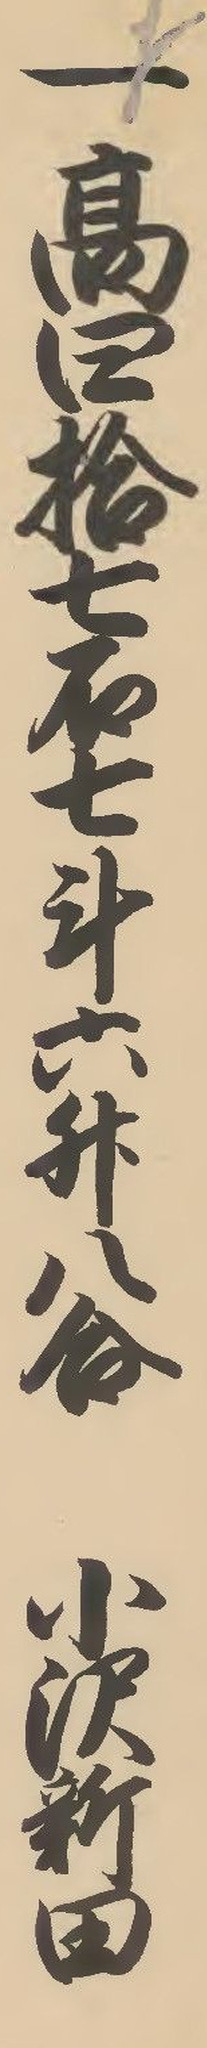一髙四拾七石七斗六升八合小沢新田
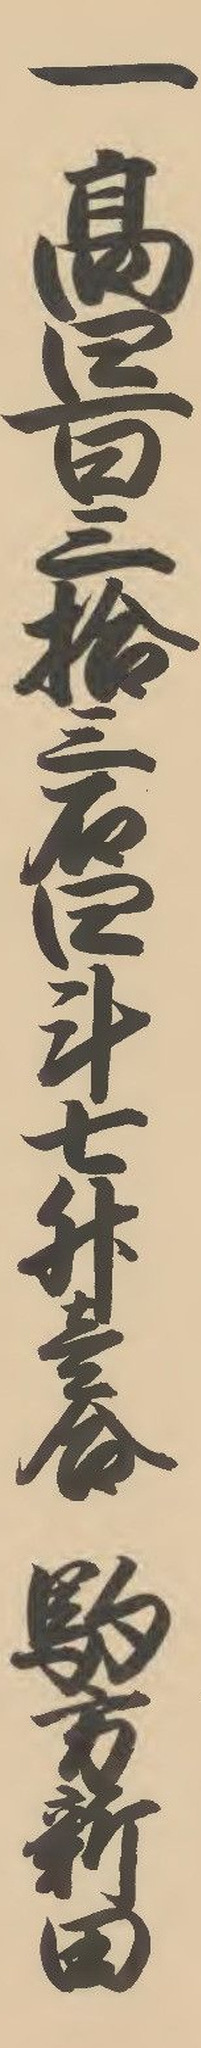一髙四百三拾三石四斗七升壱合駒方新田
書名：上野国郷帳
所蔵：国立公文書館 National Archives of Japan
